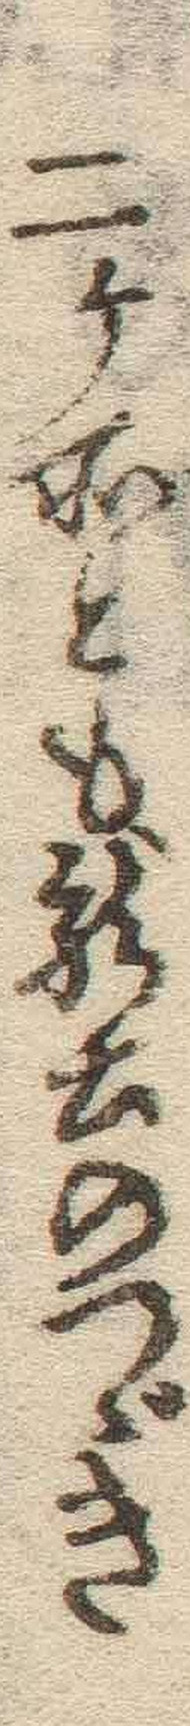二ヶ所とも龍土のつゞき
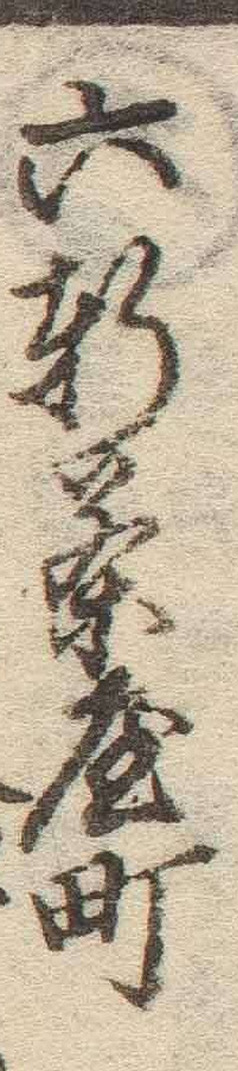六軒茶屋町
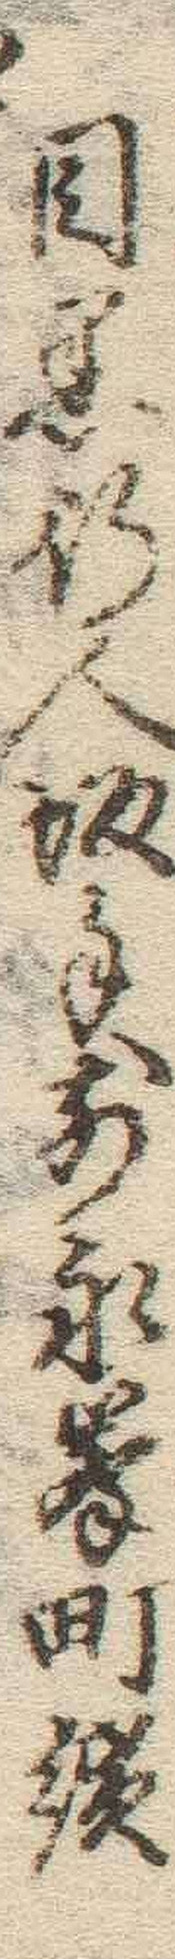目黒行人坂手前永峯町続
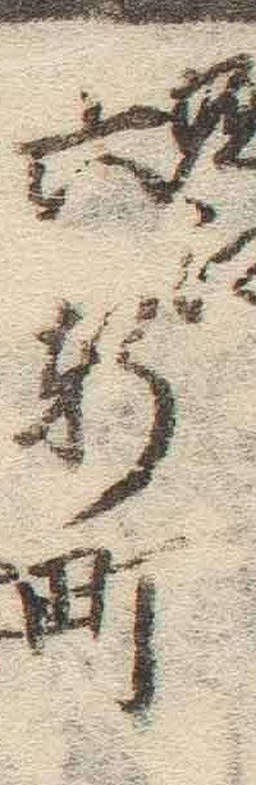六軒町
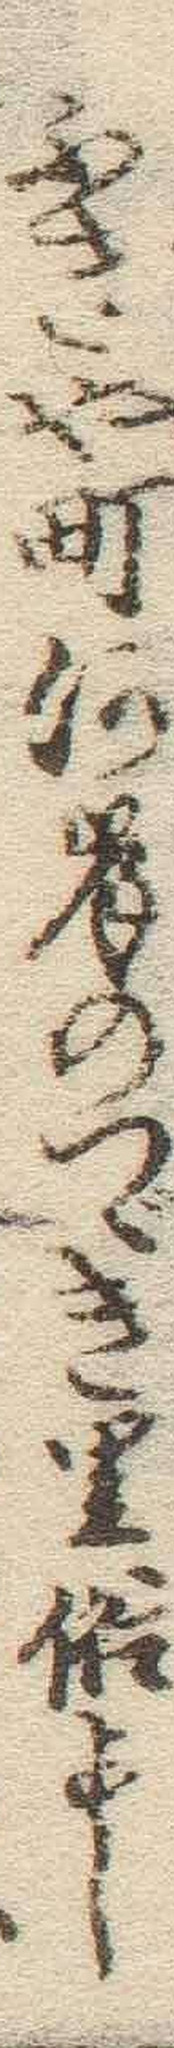ふきや町河岸のつゞき里俗よし
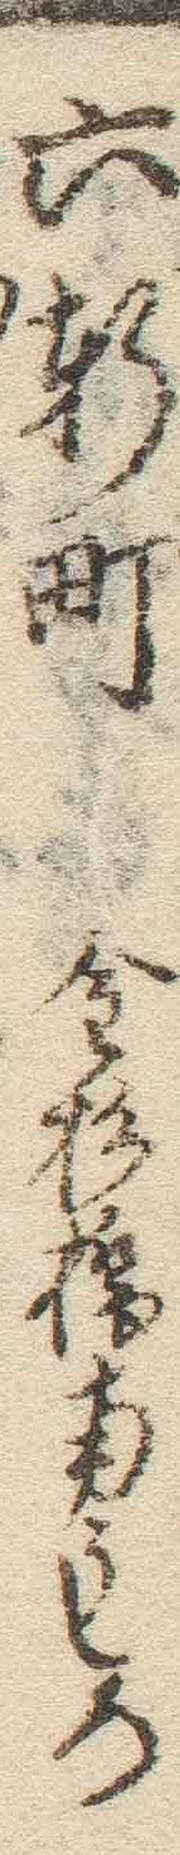六軒町金杉橋南うしろ
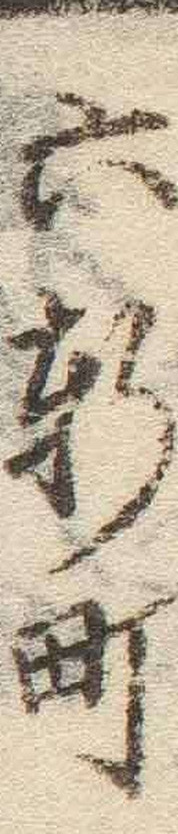六軒町
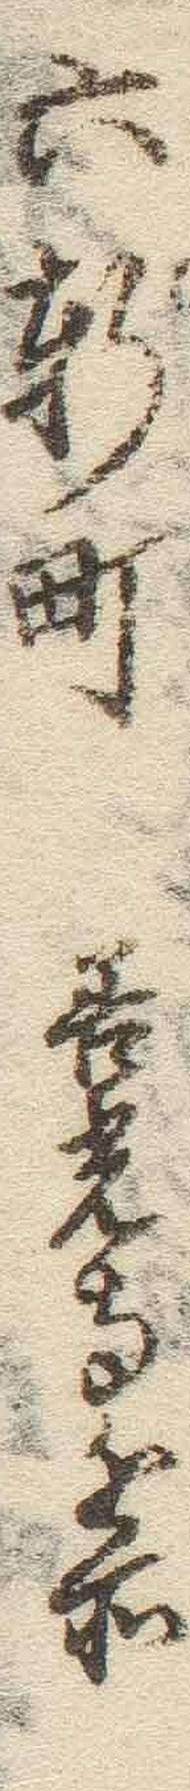六軒町善光寺近所
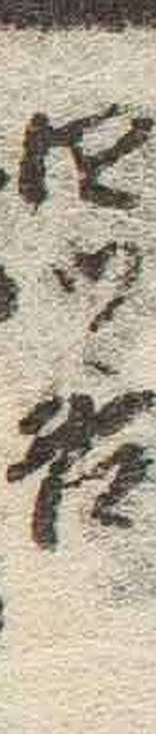四ツ谷
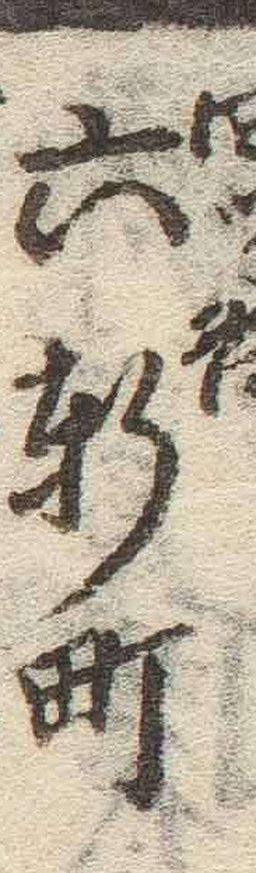六軒町
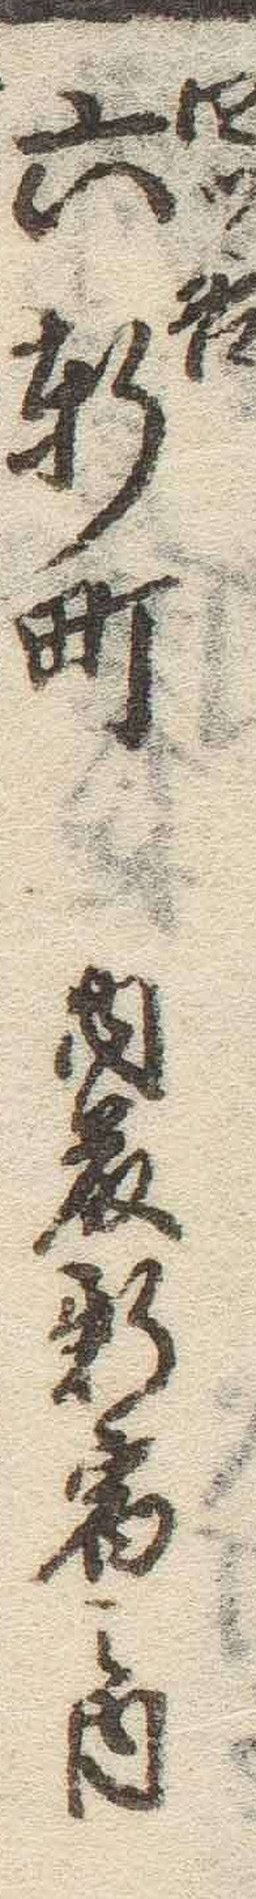六軒町内藤新宿之内
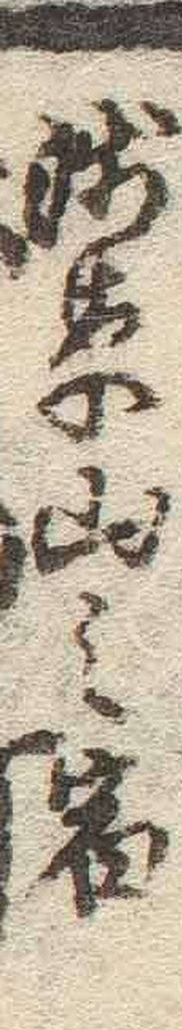浅草山之宿
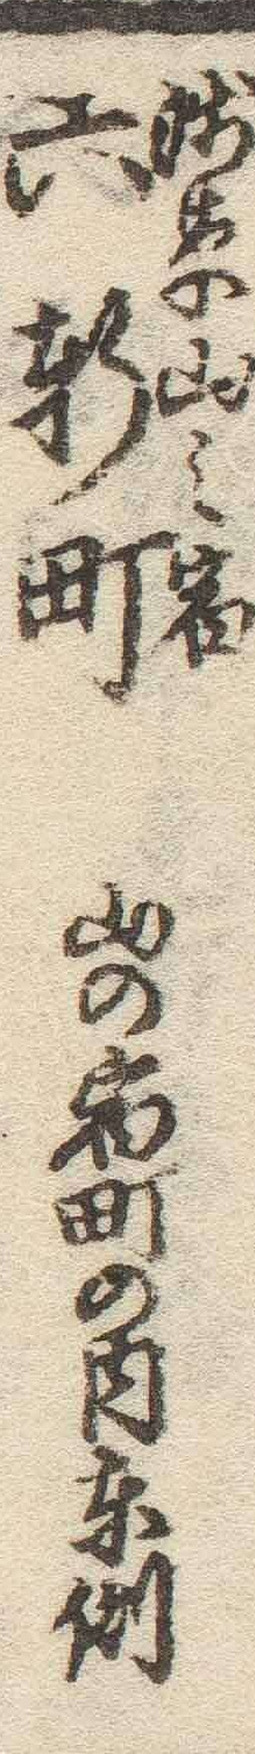六軒町山の宿町の内東側
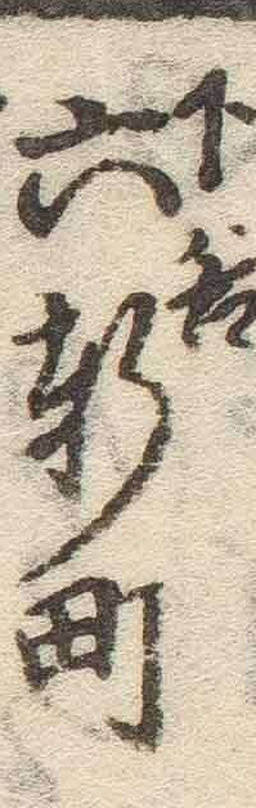六軒町
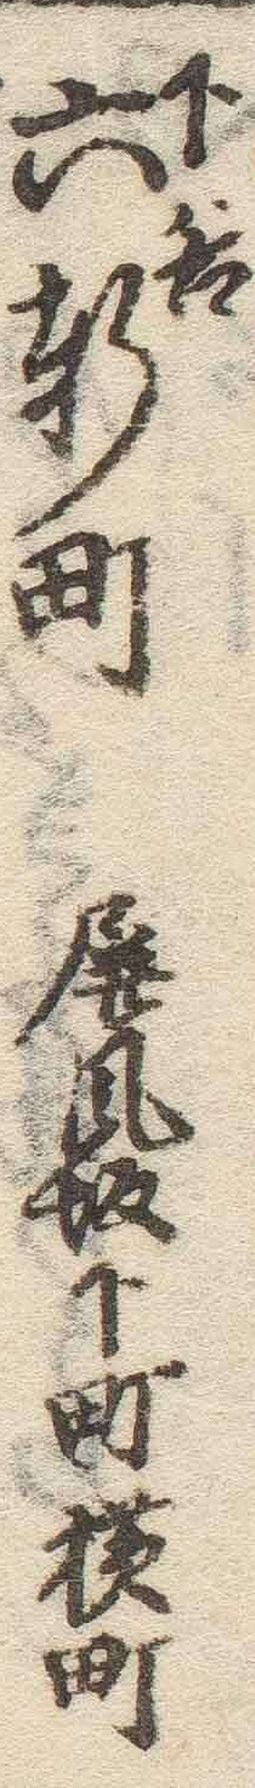六軒町屏風坂下町横町
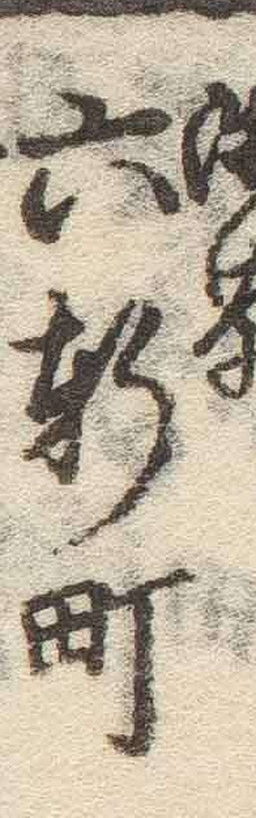六軒町
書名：江戸町独案内
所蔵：東京学芸大学附属図書館 国文学研究資料館
